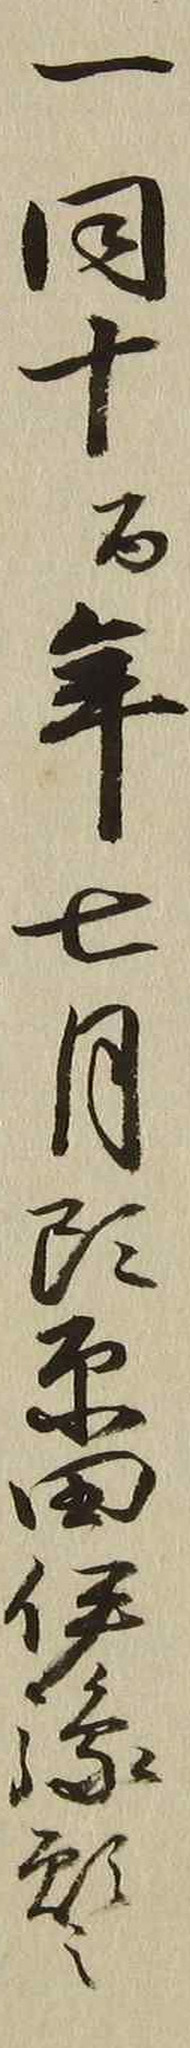一同十酉年七月頭原田伊予願之
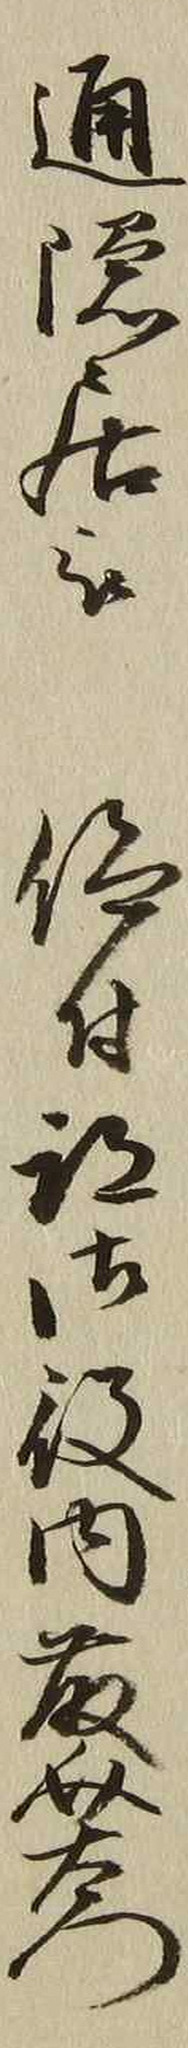通隠居被仰付跡御役内藤介左衛門
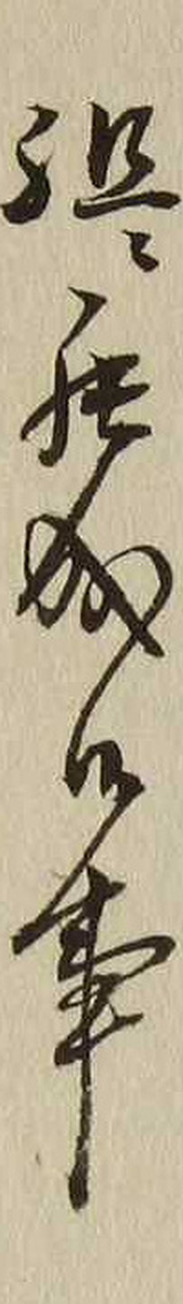組ニ罷成候事
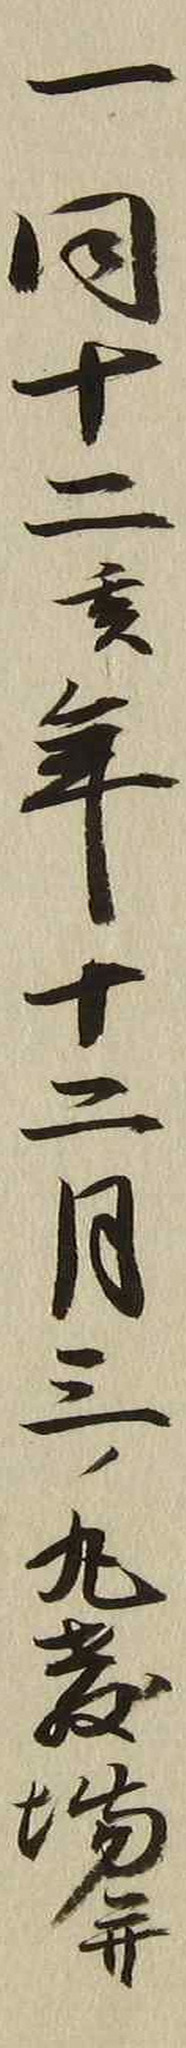一同十二亥年十二月三ノ丸教場幷
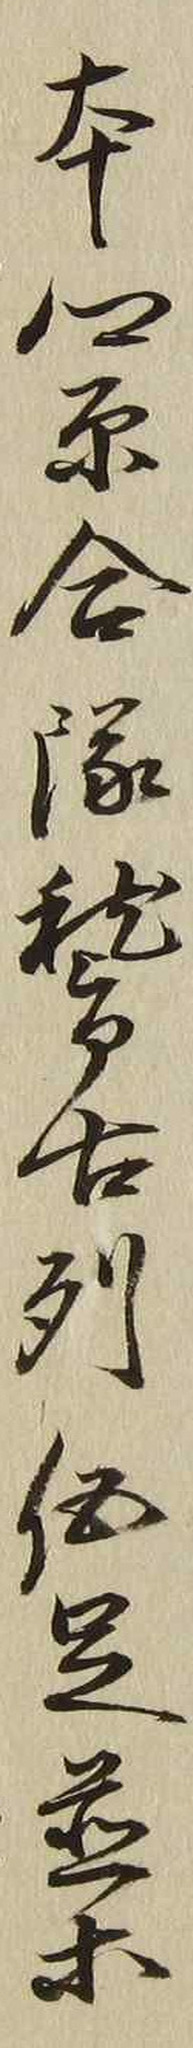本郷原合隊稽古列伍足並等
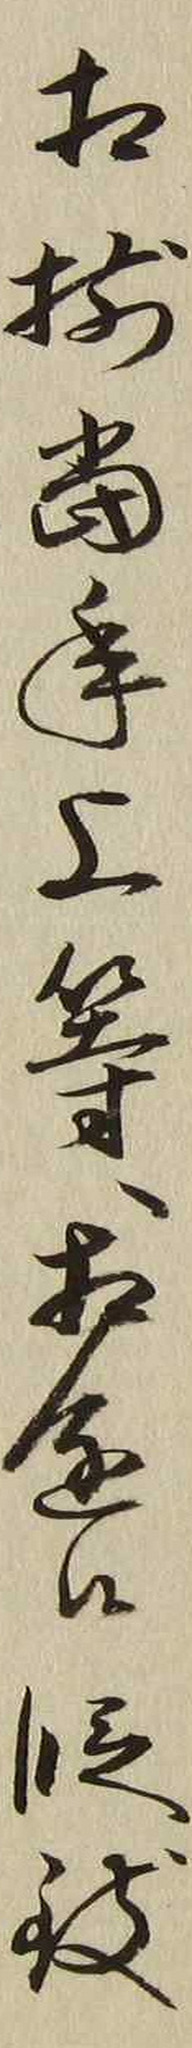相揃当年上等へ相進候段致
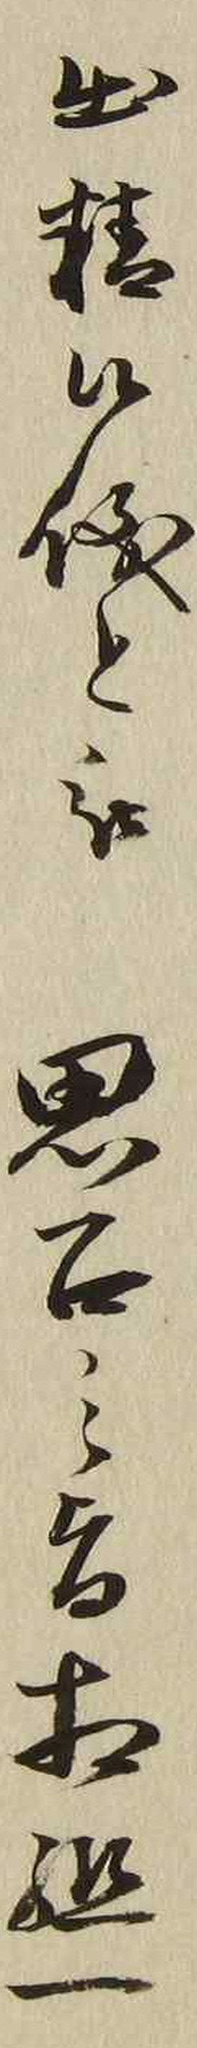出精候儀と被思召之旨相組一
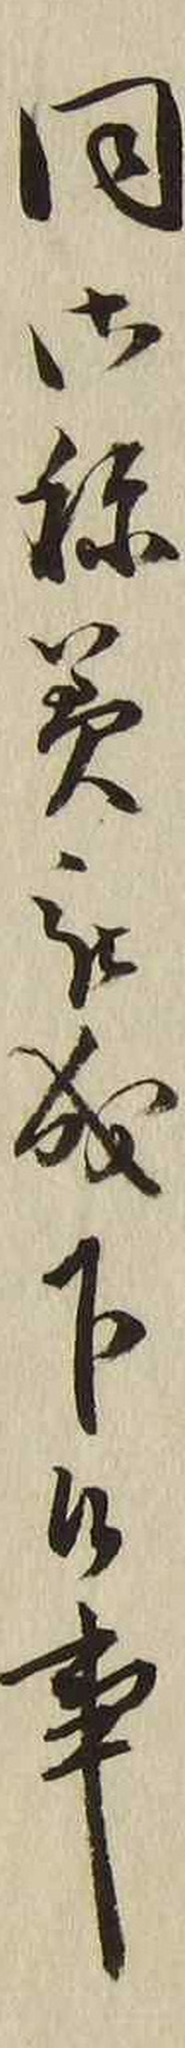同御称美被成下候事
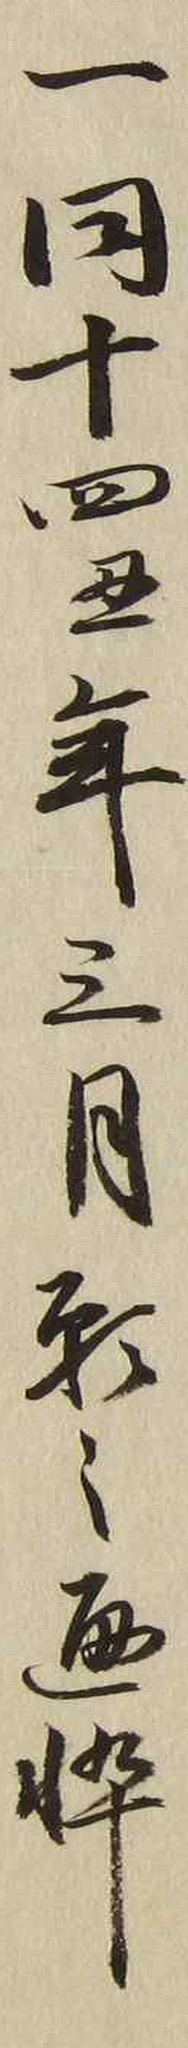一同十四丑年三月願之通忰

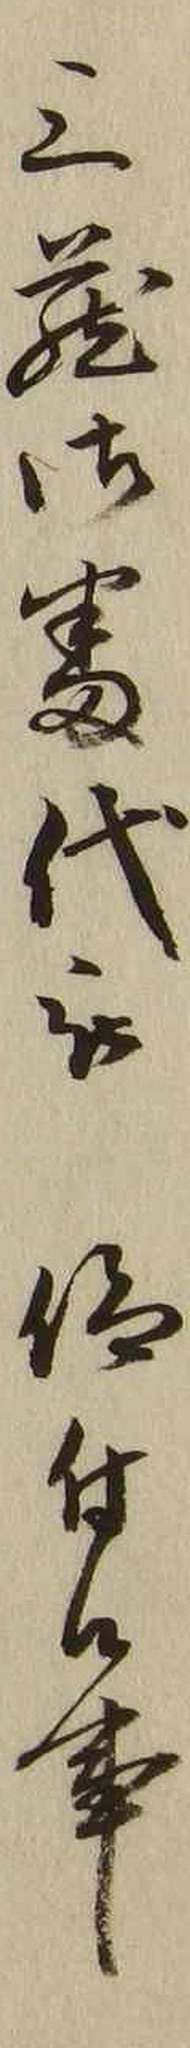三蔵御番代被仰付候事
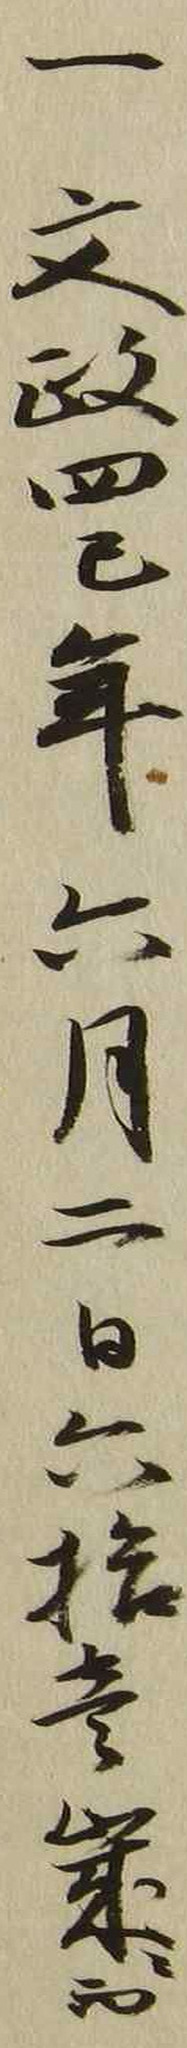一文政四巳年六月二日六拾壱歳ニ而
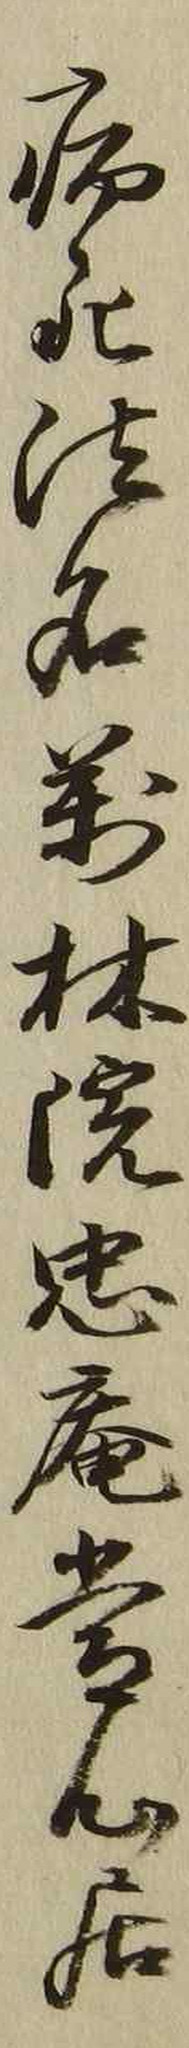病死法名万林院忠庵常心居
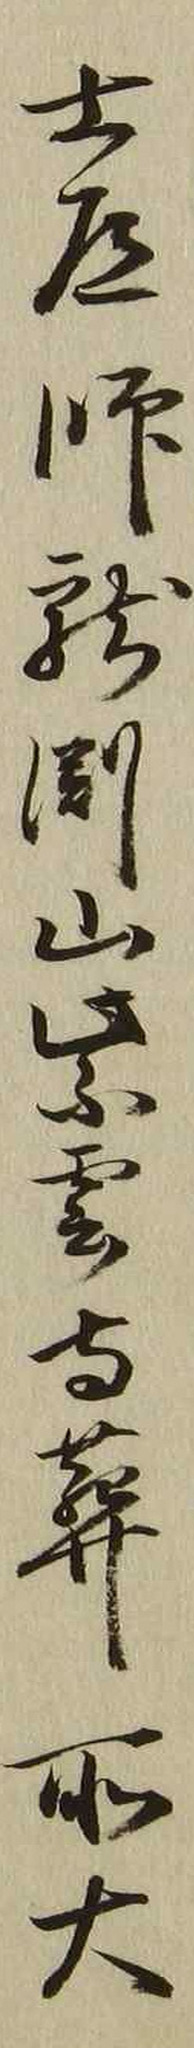士道師龍淵山紫雲寺葬所大
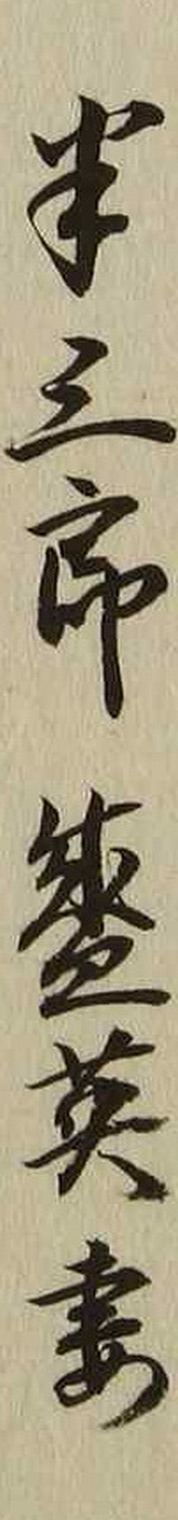半三郎盛英妻
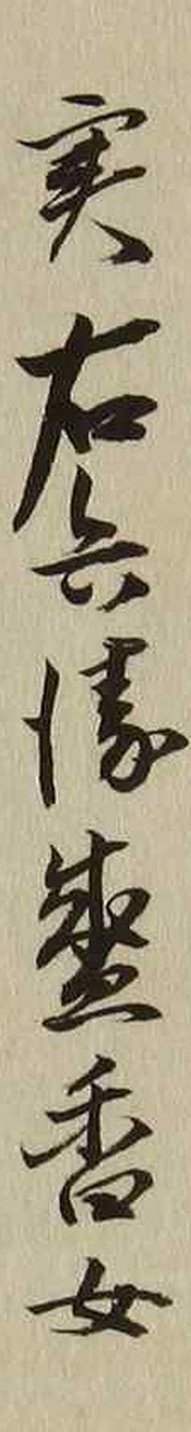実右兵衛盛香女
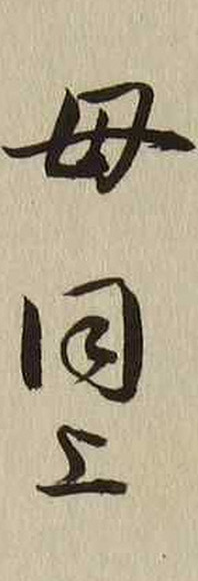母同上
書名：諸士系譜　巻之61　と之部4
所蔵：会津若松市立会津図書館
